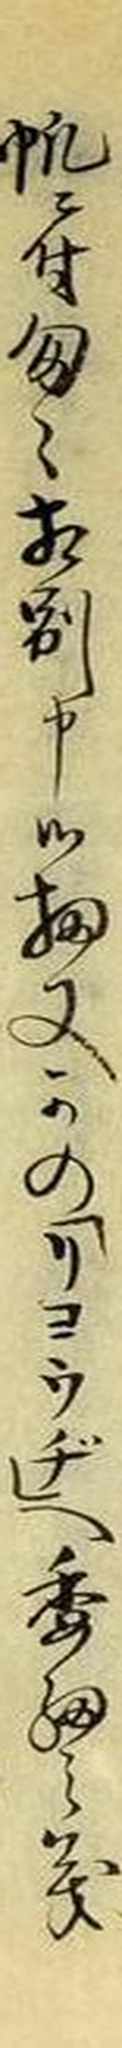帆ニ付怱々相別申候扨又かの「リヨウヂ」へ委細之義
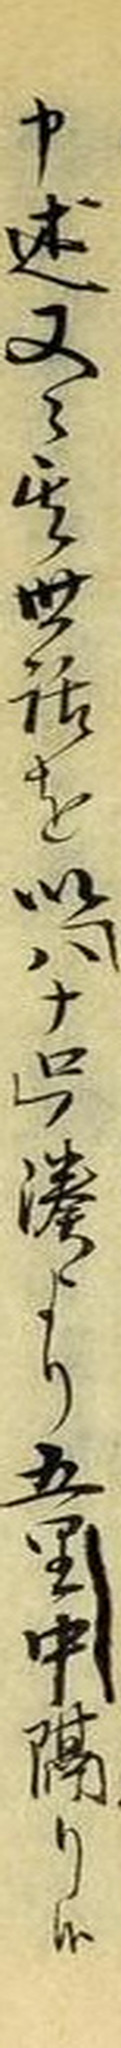申延又々其世話を以「ハナロ」ノ湊より五里中隔り候
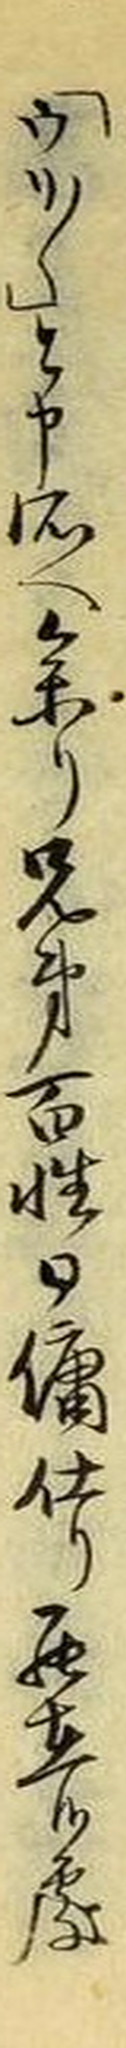「ウリ〳〵」と申所へ参り兄弟百姓日傭仕り罷在候處
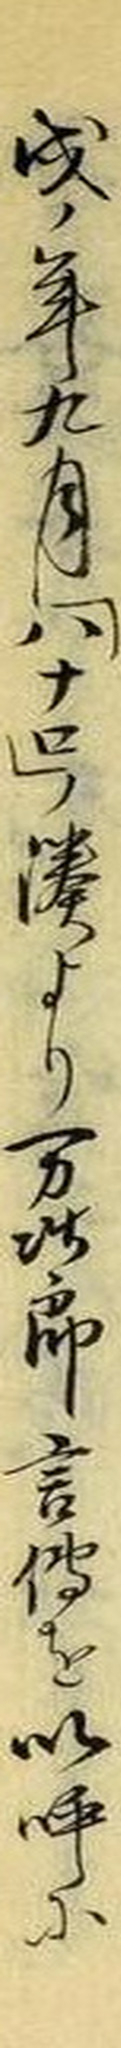戊ノ年九月「ハナロ」ノ湊より万次郎言伝を以呼に
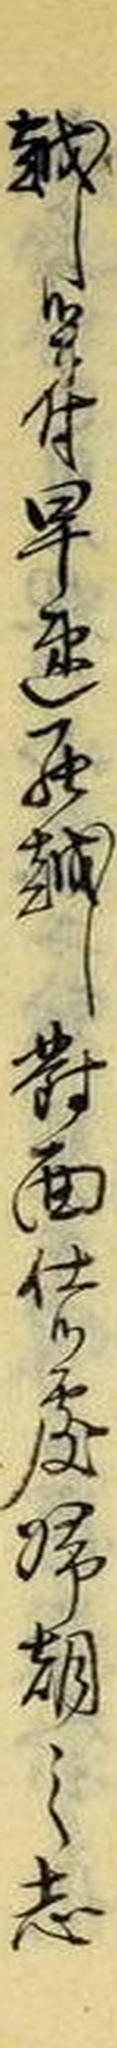越し候ニ付早速罷越し対面仕候處帰朝之志
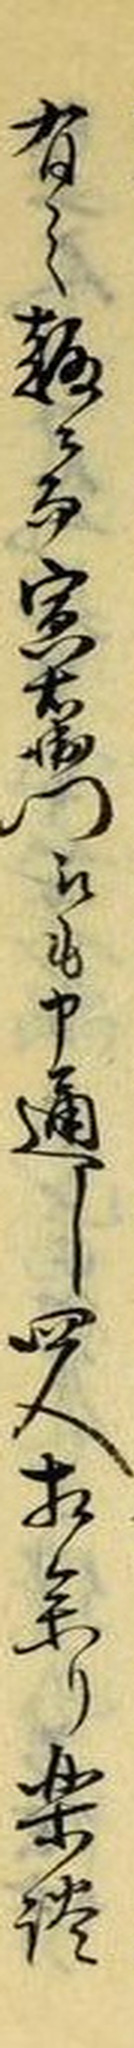有之趣ニ而寅右衛門へも申通し四人相参り楽談
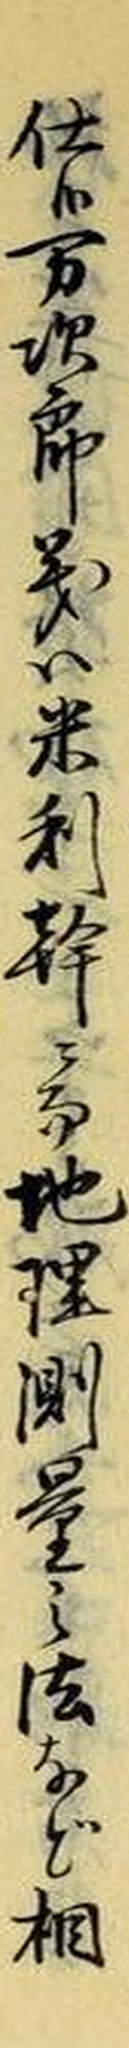仕候万次郎義ハメリカニ而地理測量之法など相
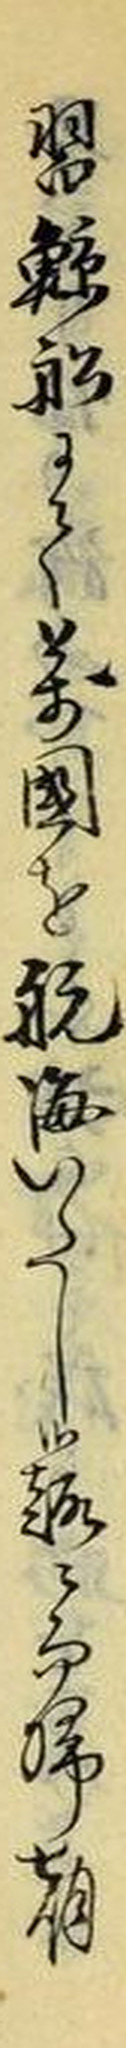習鯨船にて万国を航海いたし候趣ニ而帰朝
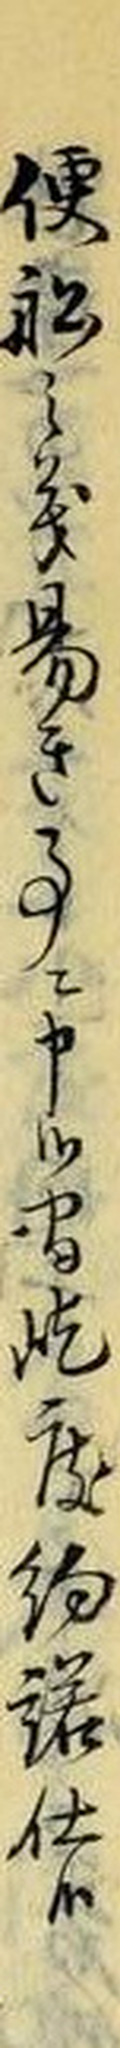便船之義易き事ニ申候間屹度約諾仕候
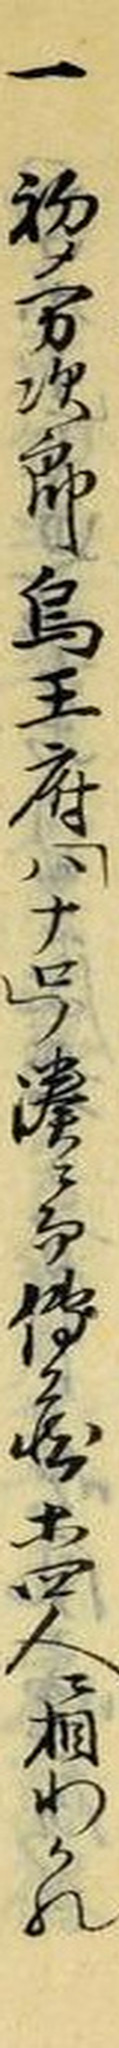初メ万次郎烏王府「ハナロ」ノ湊ニ而伝兵衛等四人ニ相わかれ
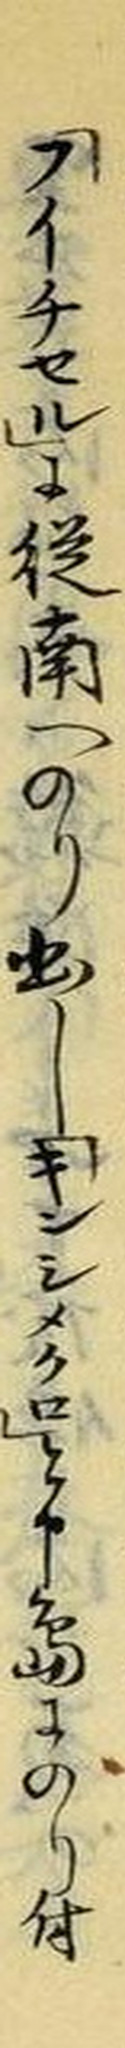「フイチセル」に従南へのり出し「キンシメクロ」と申島にのり付
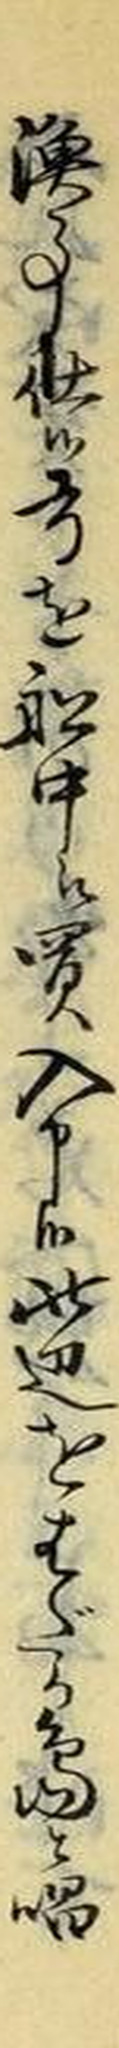漁事仕候方を船中へ買入申候此辺をはだか島と唱
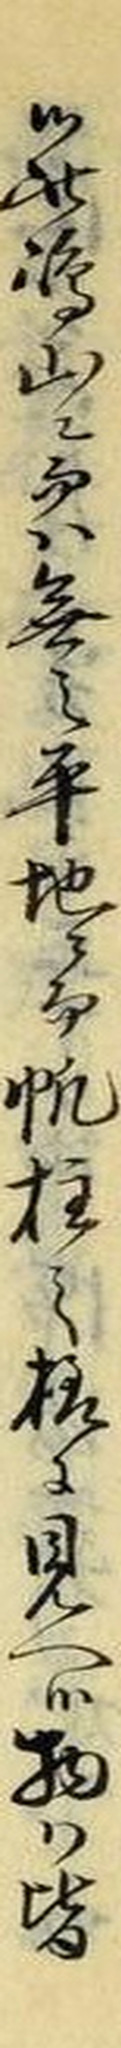候此島山ニ而ハ無之平地ニ而帆柱之様に見へ候物ハ皆
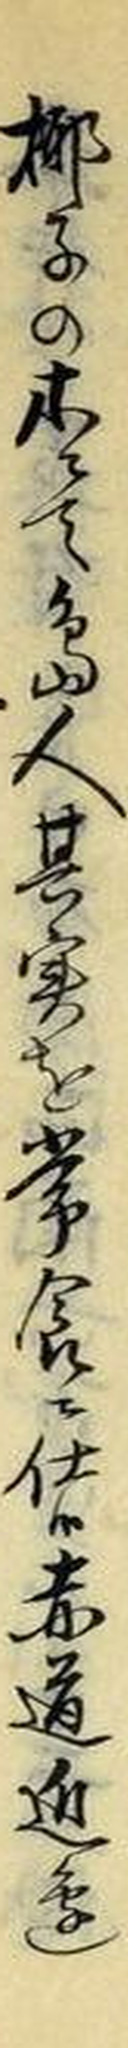椰子の木にて島人其実を常食ニ仕候赤道近辺
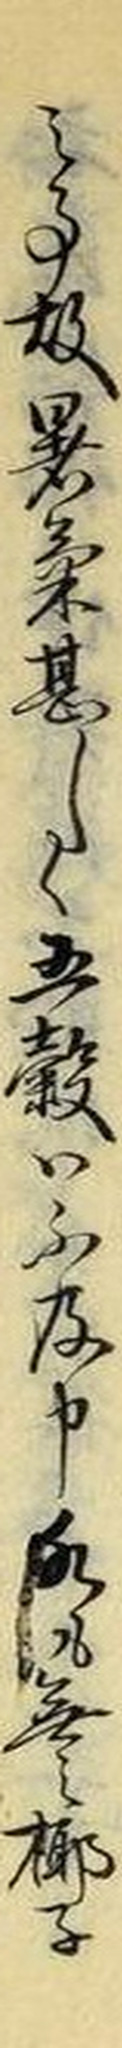之事故暑気甚しく五穀ハ不及申水も無之椰子
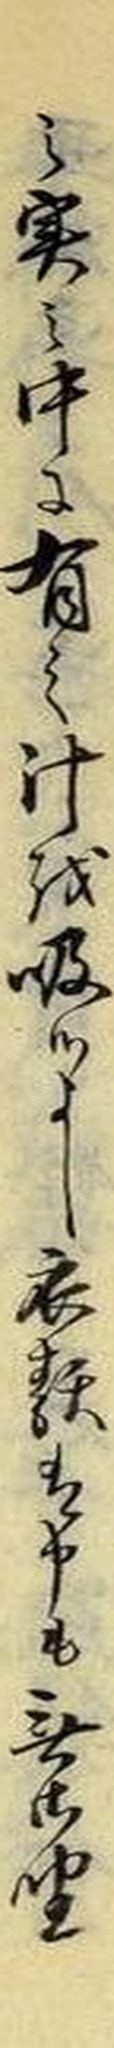之実之中に有之汁を吸候よし衣類は申も無御座
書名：漂客談奇（備考雑録写8）
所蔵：福井県文書館 Fukui Prefectural Archives
